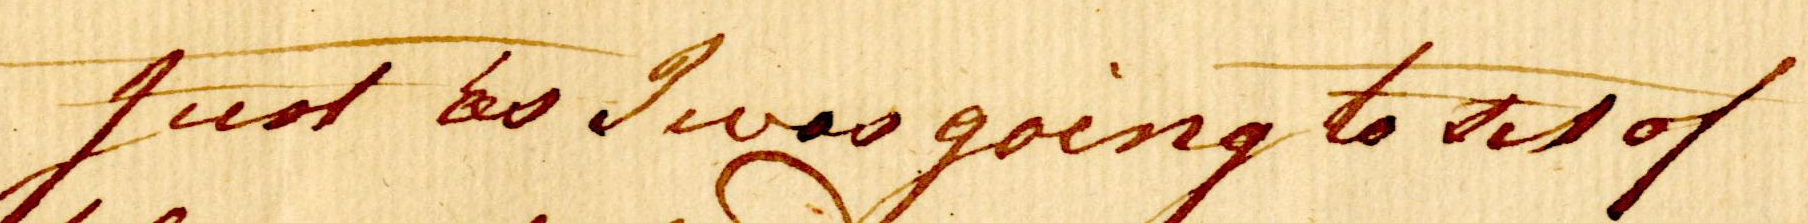Just as I was going to set of
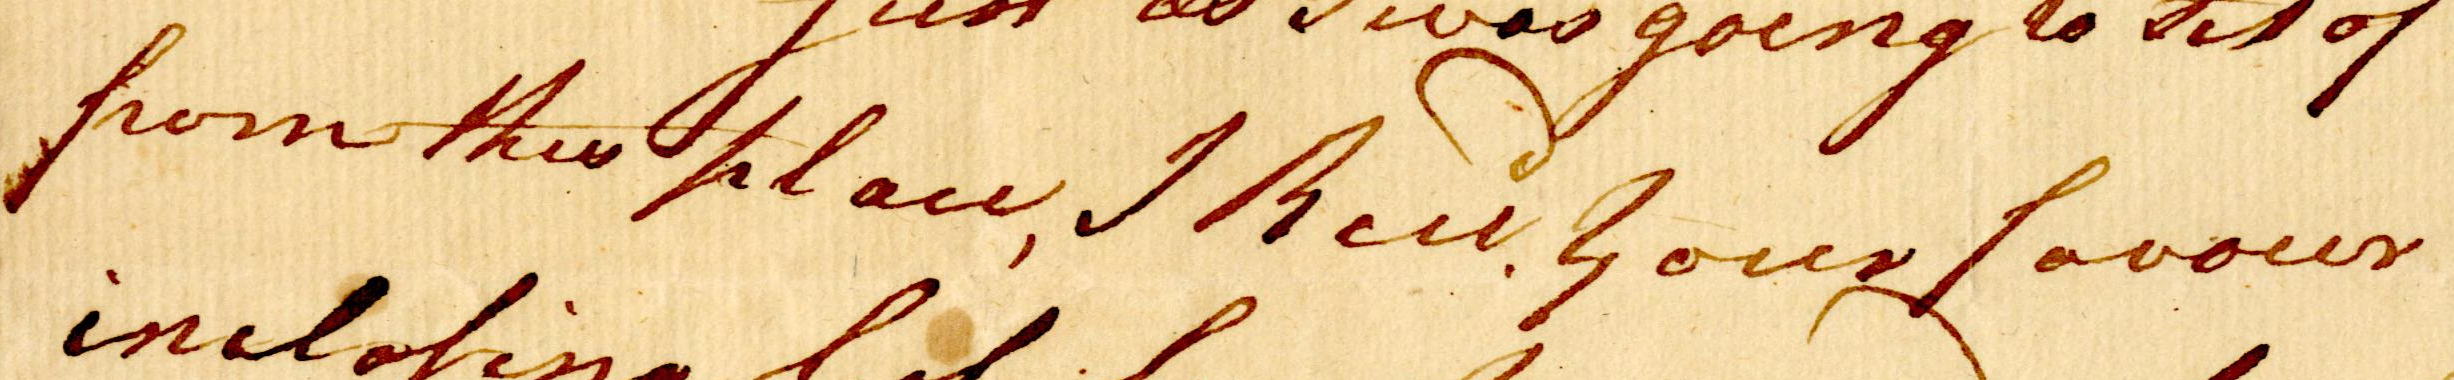fom this place, I rece^d your favour
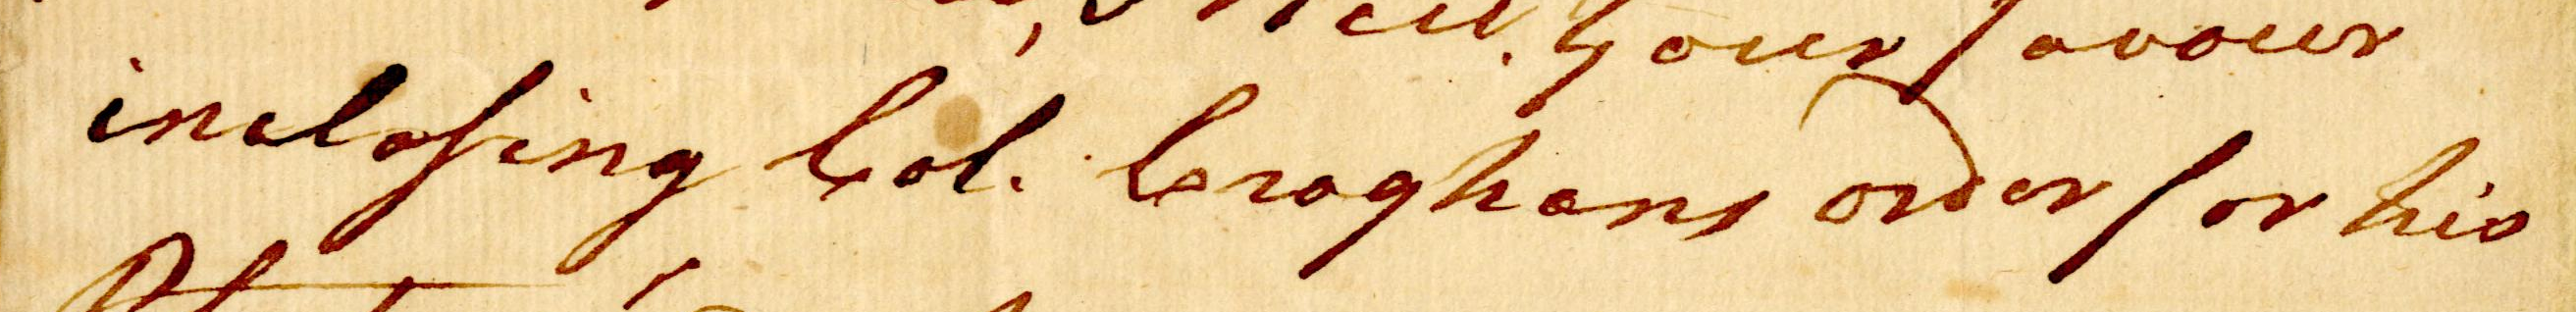inclosing Col. Croghans order for his
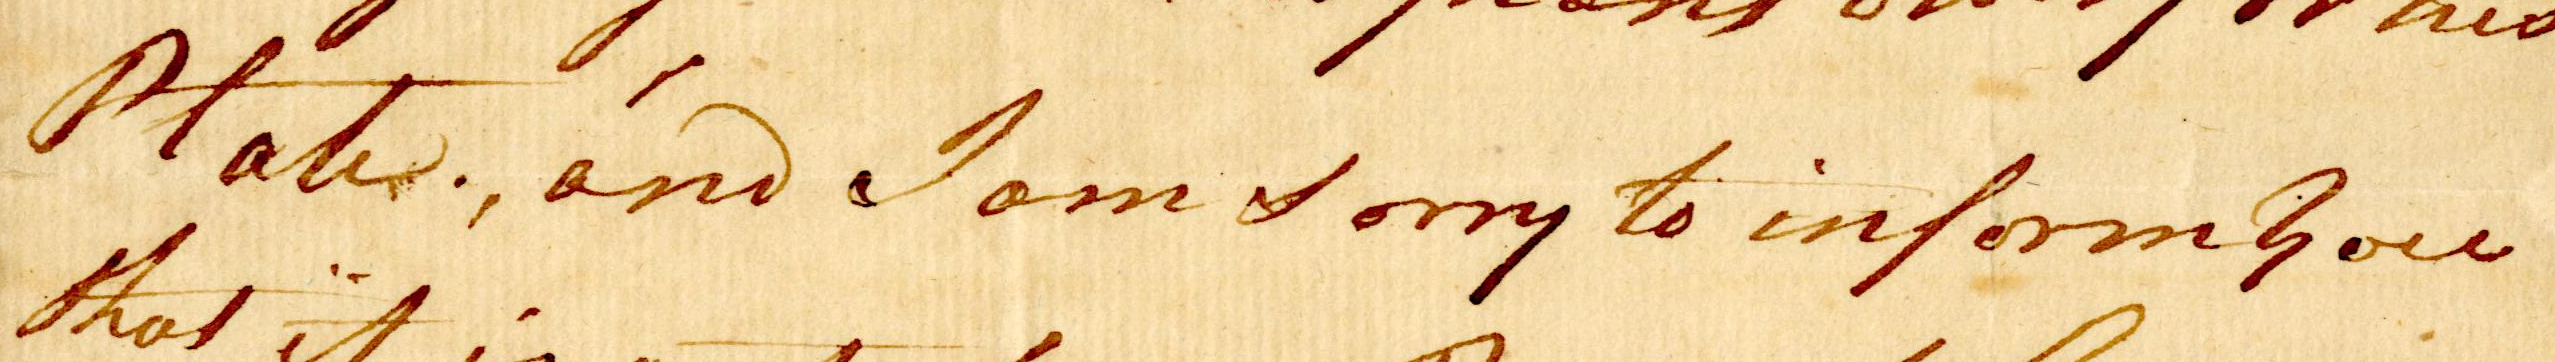Plate, and I am sorry to inform you
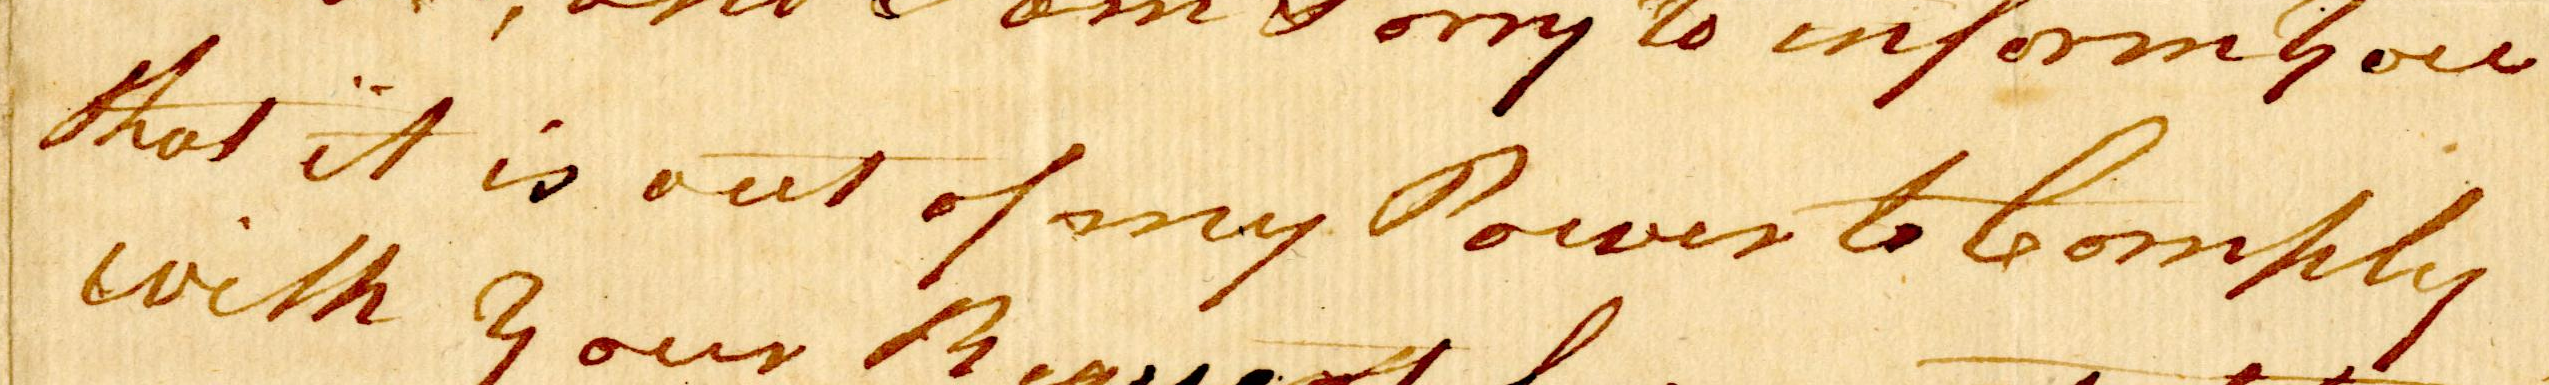that it is out of my Power to Comply
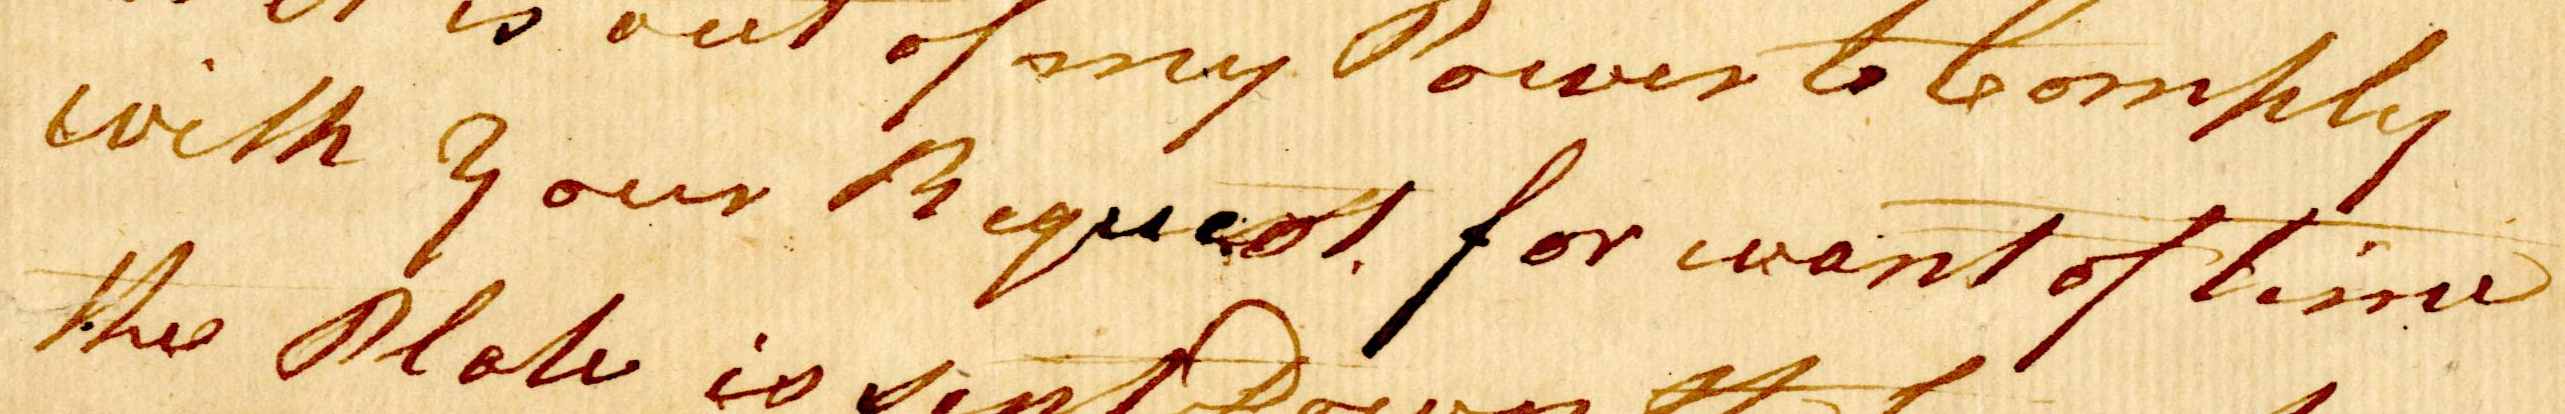with Your Request for want of time
